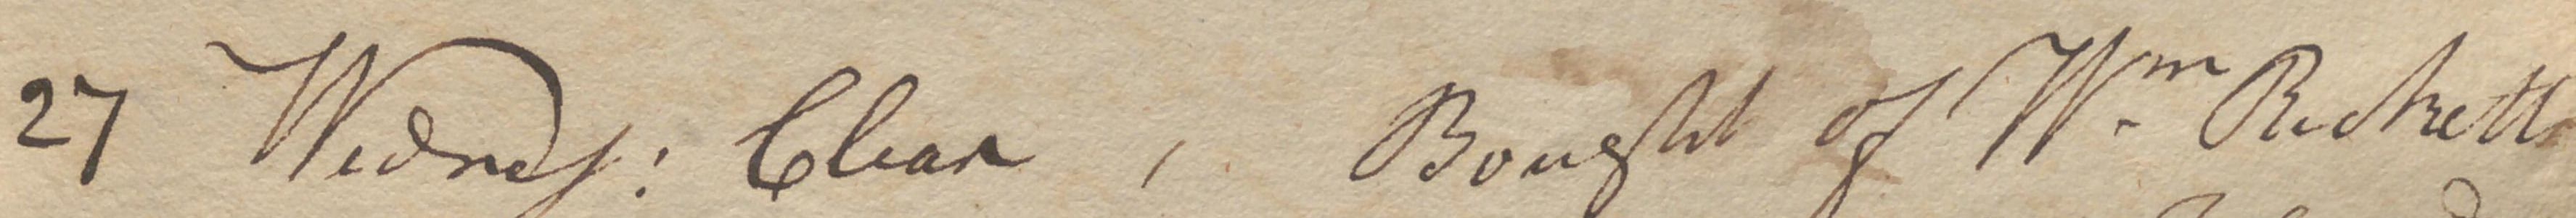27 Wednes: Clear, Bought of W^m. Ricketts
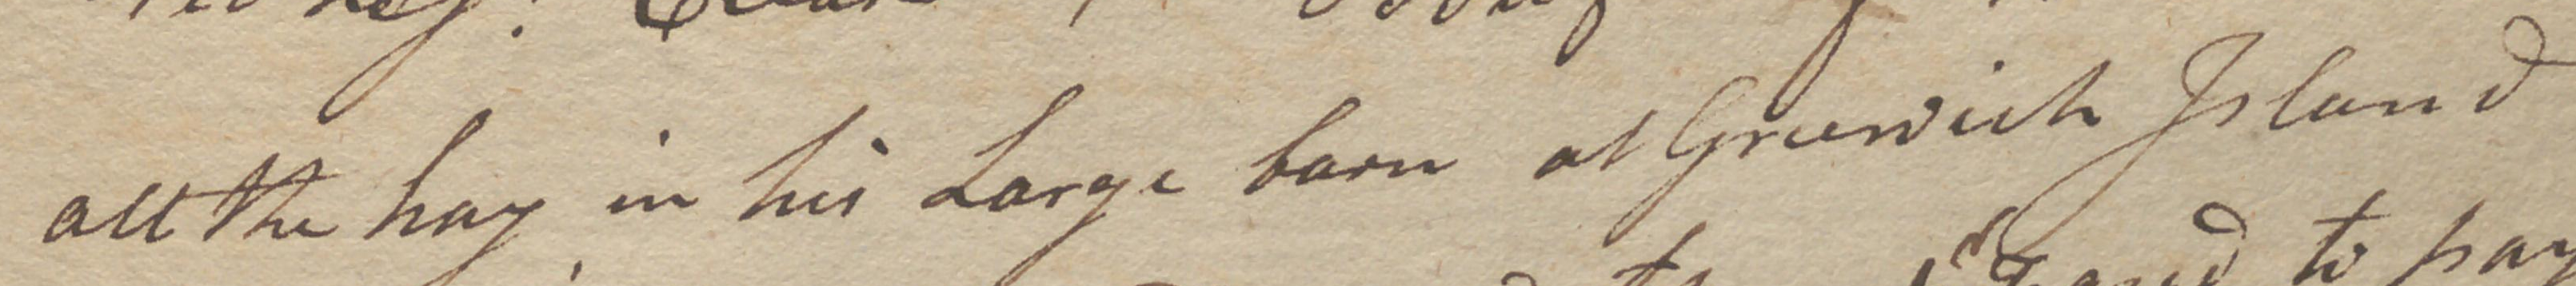all the hay in his Large barn at Greewich Island
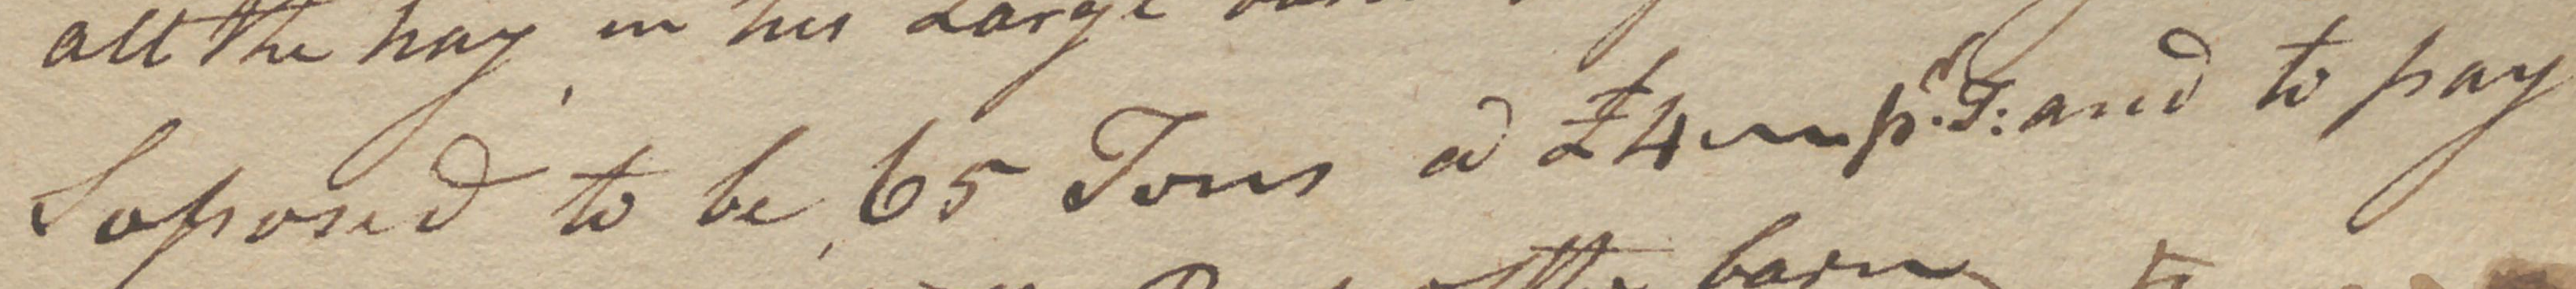Soposed to be 65 Tons @ £4- p^r : and to pay
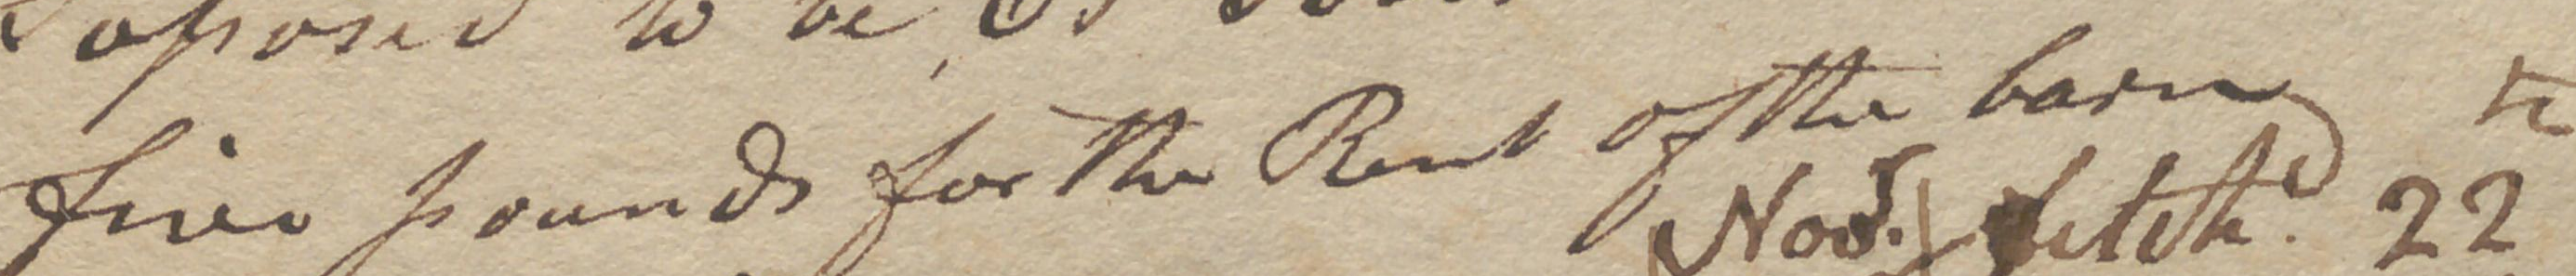five pounds for the Rent of the barn,
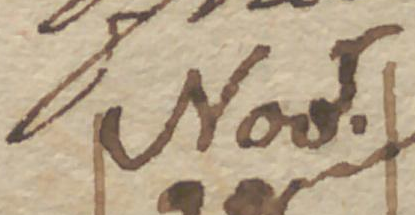Nov.r
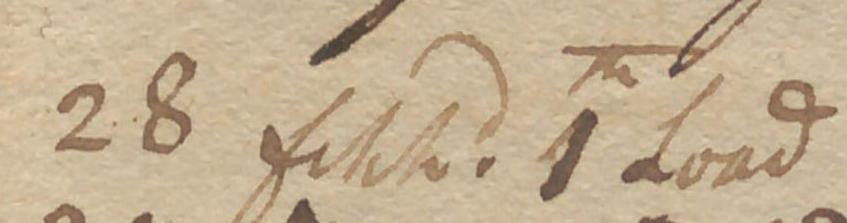28 Jetch^d. 1 Load
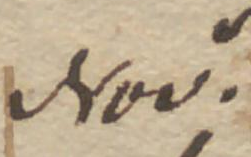Nov^r.
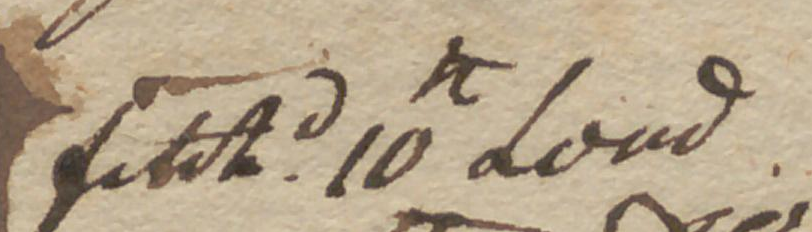fetch^d. 10^th Load.
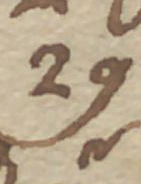29
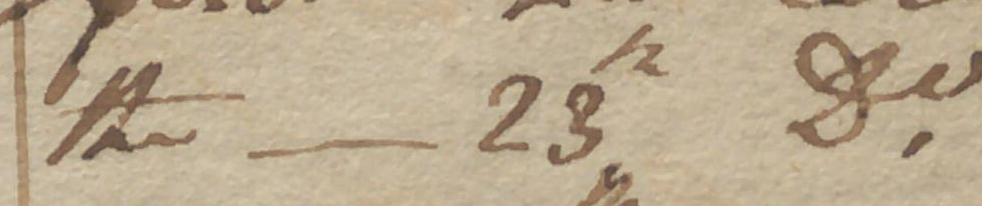the 23^th D^o.
